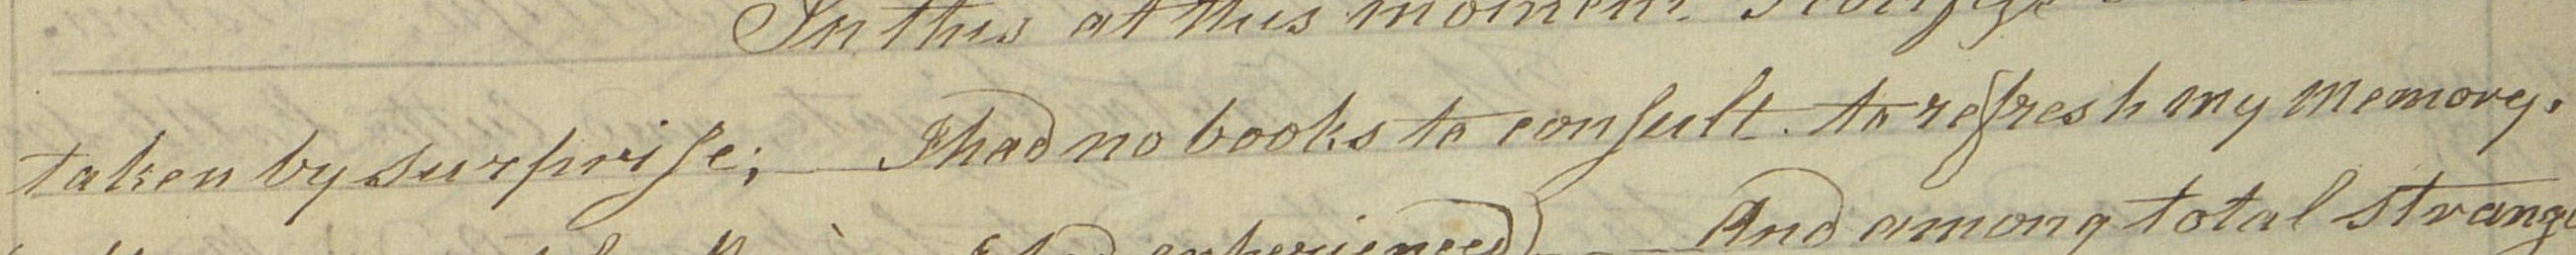taken by surprise; I had no books to consult to refresh my memory
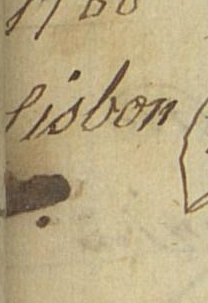Lisbon
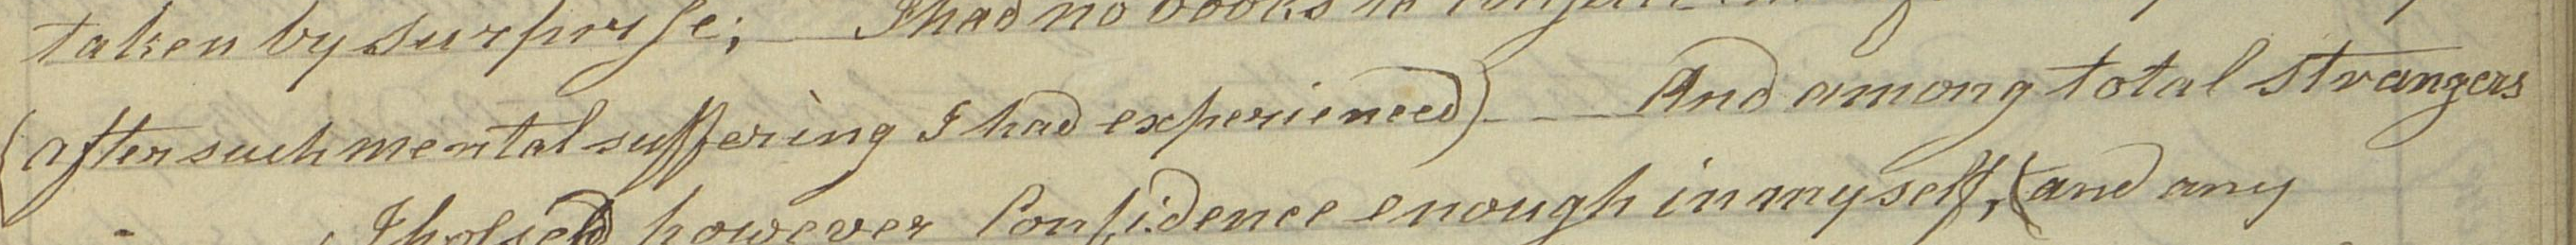(after such mental suffering I had experienced) And among total strangers
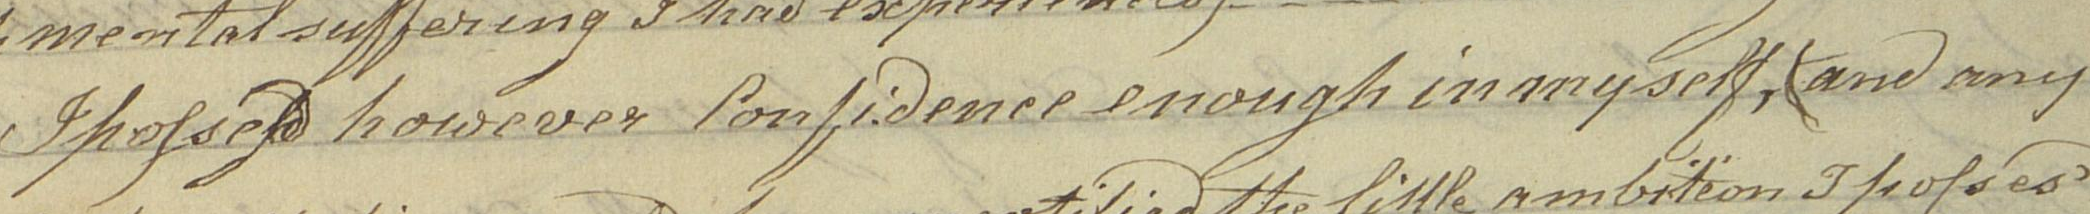I possesd however confidence enough in myself, (and any
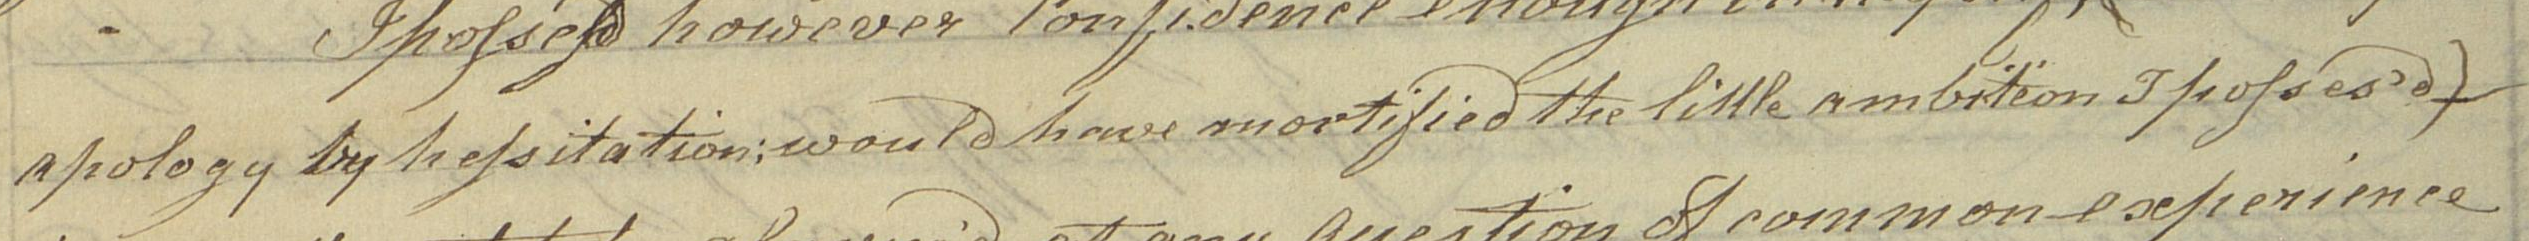apology by hessitation; would have mortified the little ambition I posses'd)
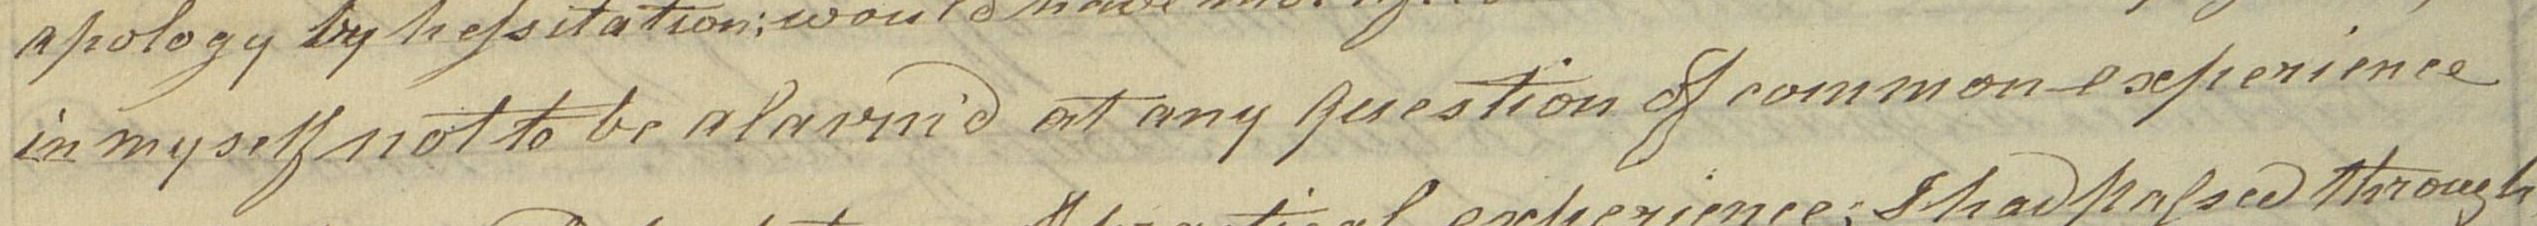in my self not to be alarm'd at my question of common experience
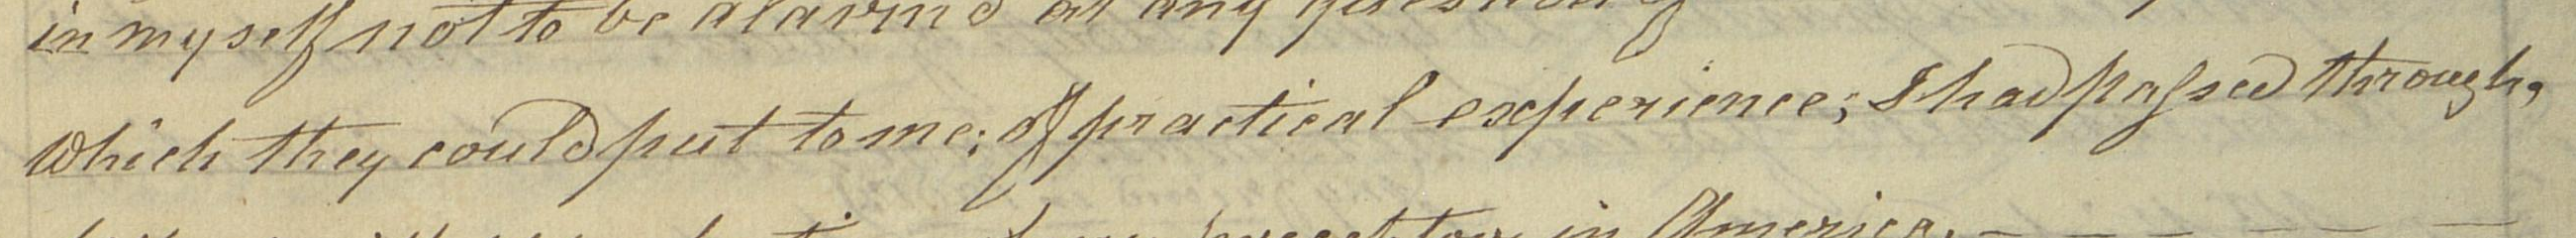Which they could put to me; of practical experience, I had passed through,
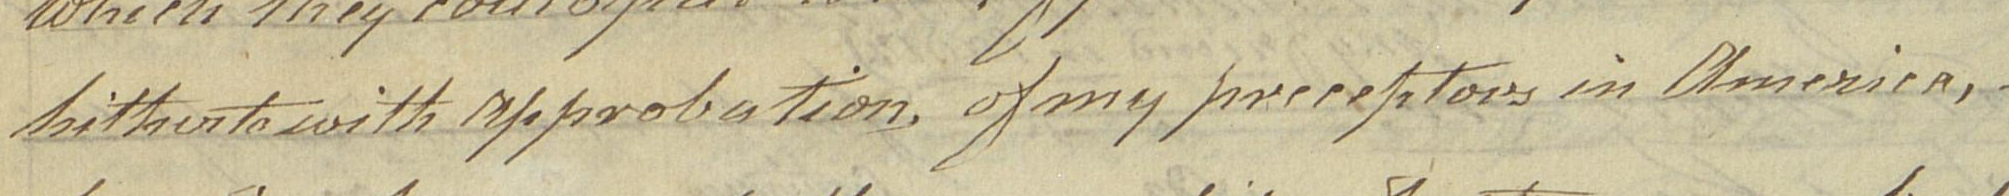hitherto with approbation of my preceptors in America,
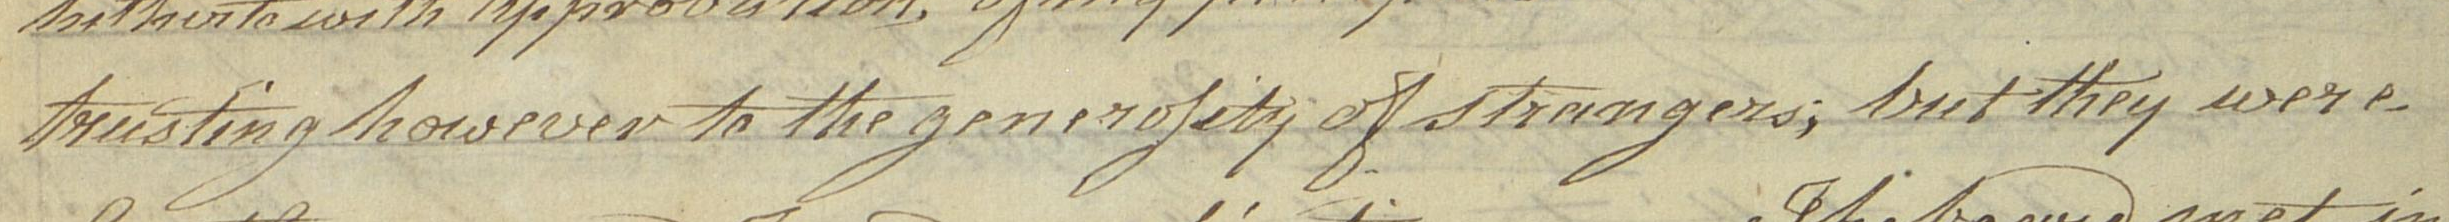trusting however to the generosity of strangers; but they were
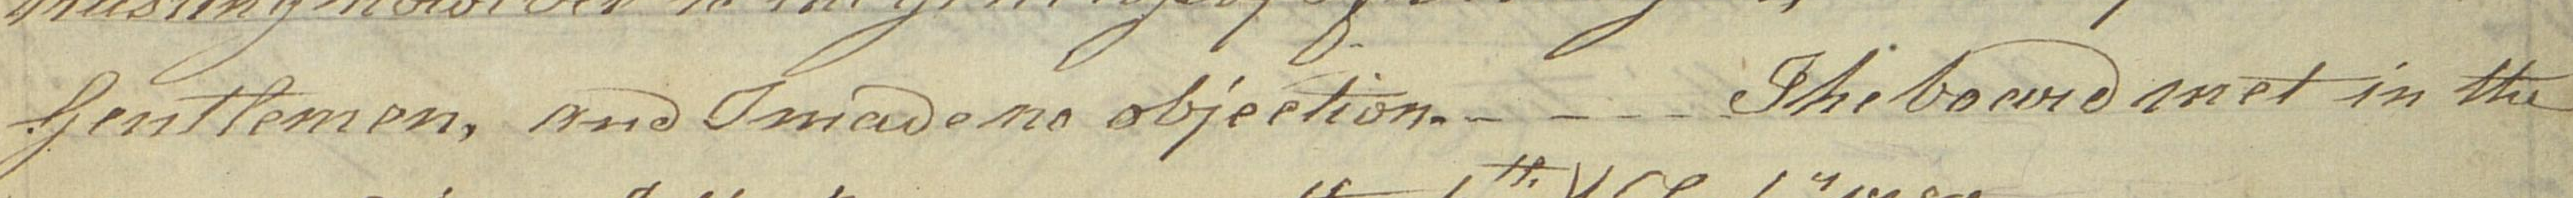Gentlemen, and I made no objection. The board met in the
